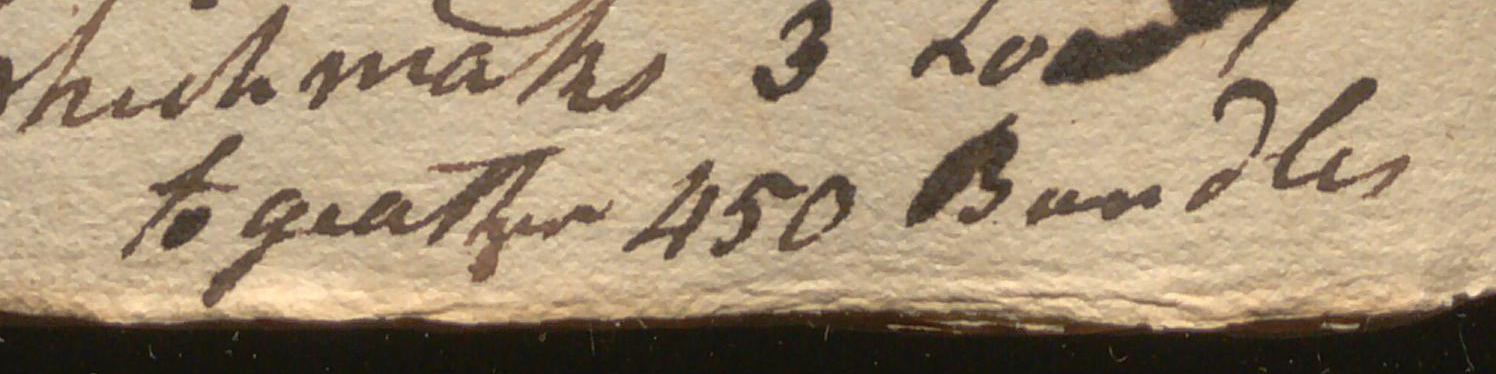to geather 450 Bundles
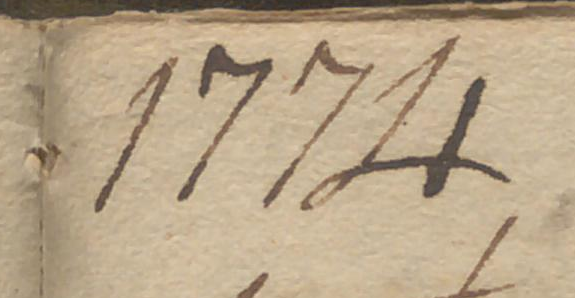1774
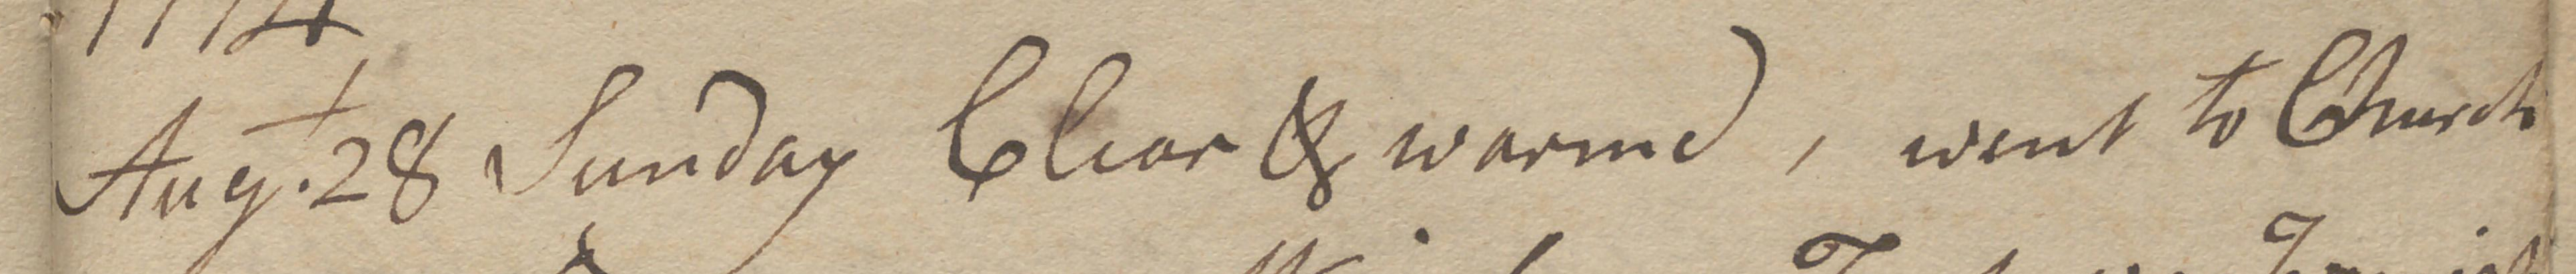Aug^t. 28 Sunday Clear & warme, went to Church
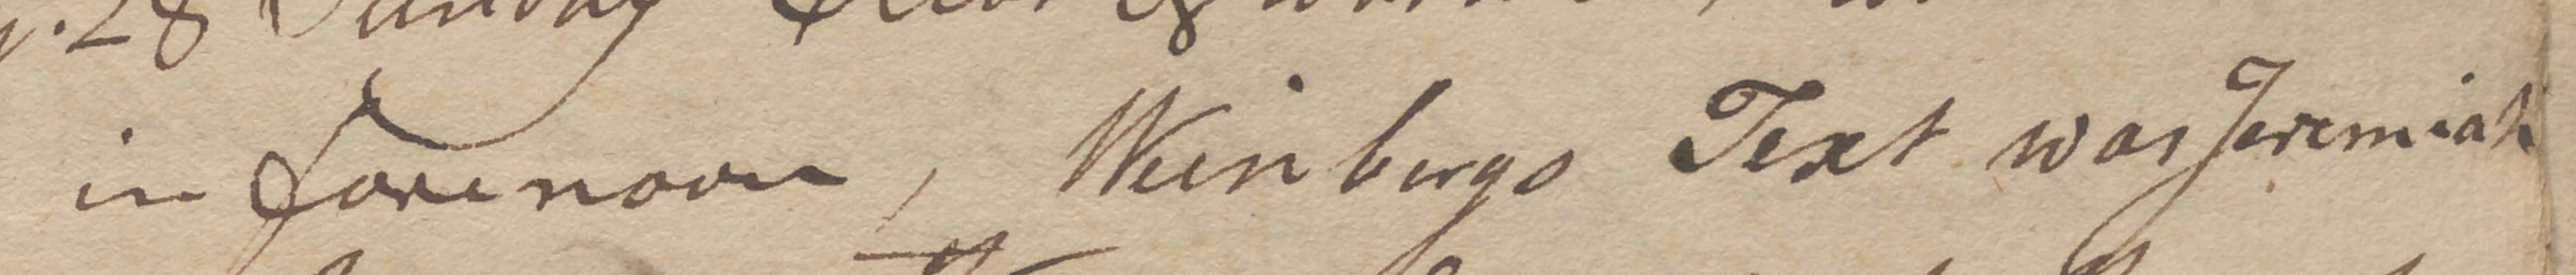in forenoon, Weinbergs Text was Jeremiah
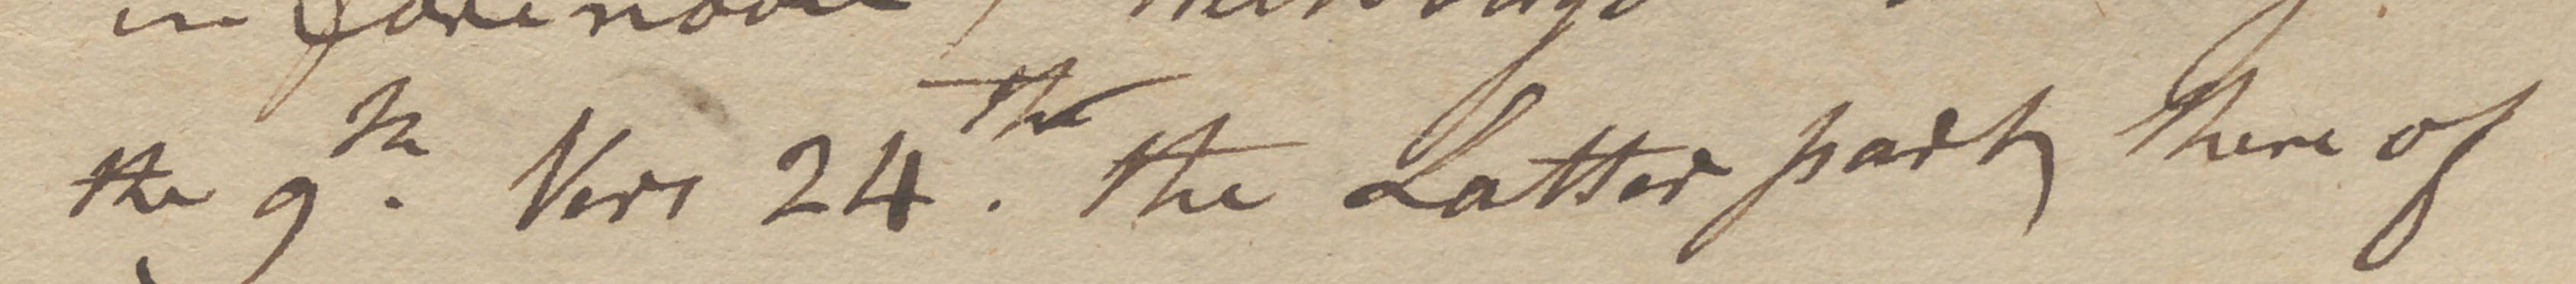the 9^th. Vers 24^th. the Latter part there of
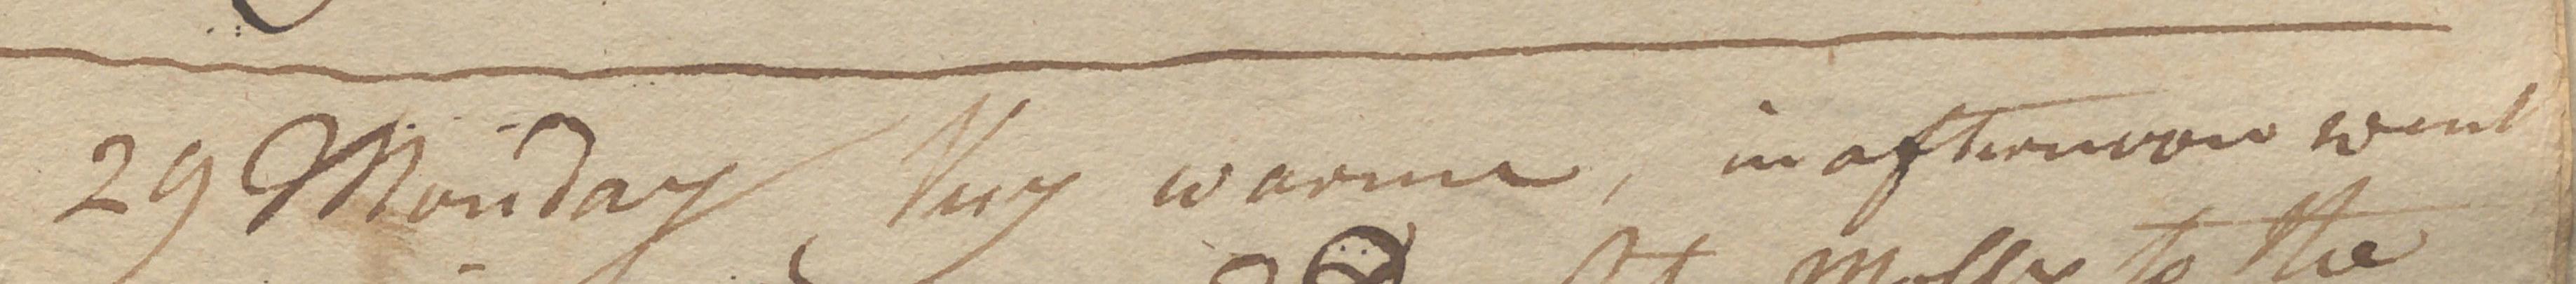29 Monday Vey warme, in afternoon went
